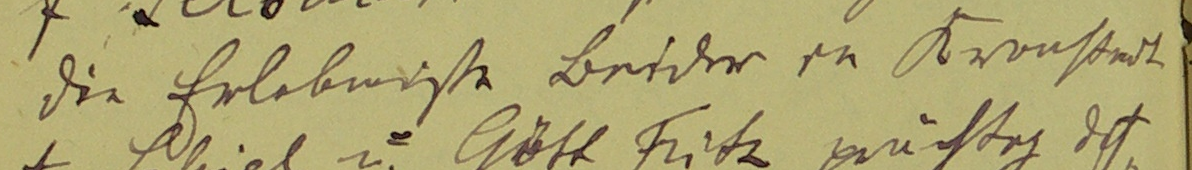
die Erlebnisse Beider in Kronstadt
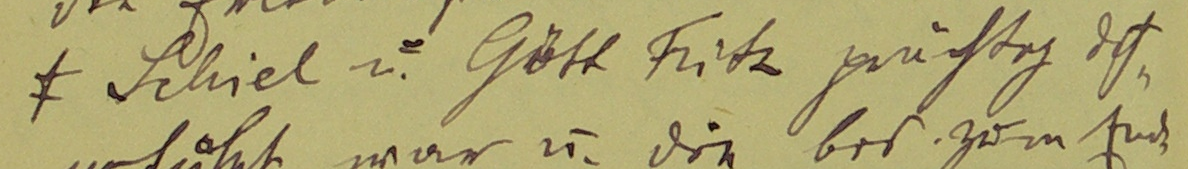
mit Schiel und Gött Fritz prächtig durch¬
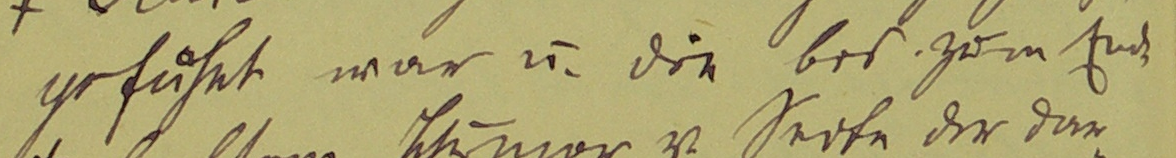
geführt war und die bis zum Ende
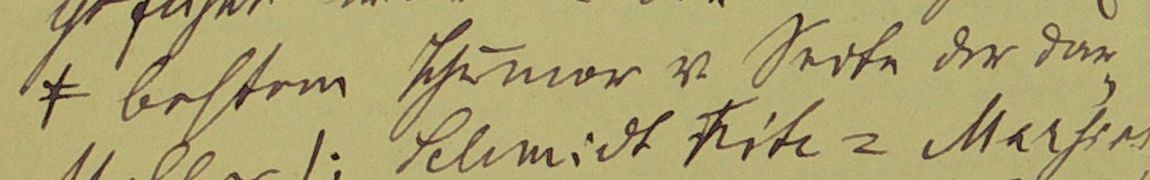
mit bestem Humor von Seite der Dar¬
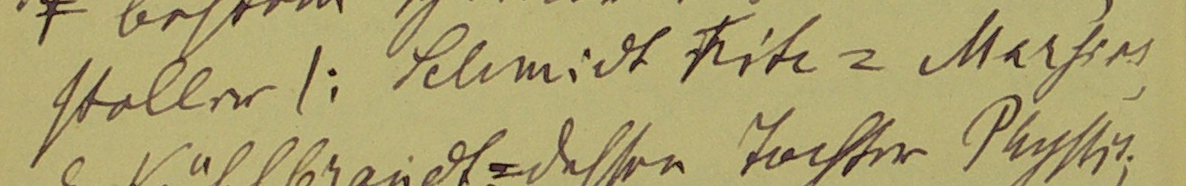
stell (;-Schmidt Fritz= =Maihias;
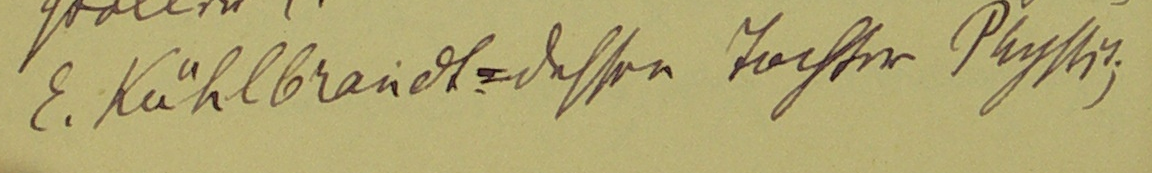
E. Kühlbrandt= dessen Tochter Philis
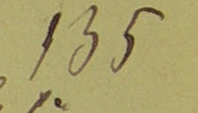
135
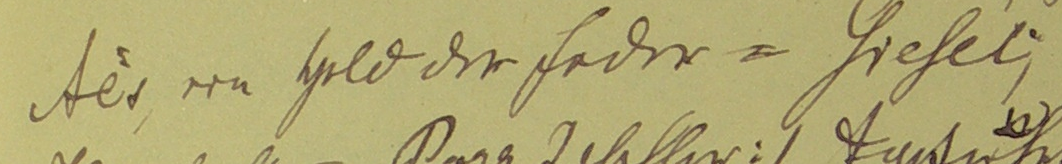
ter von Heldenhader= Greset,
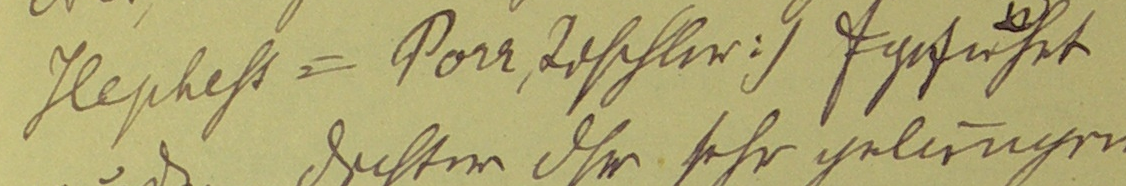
Hephest = Porr; Tischler: )- aufgeführt
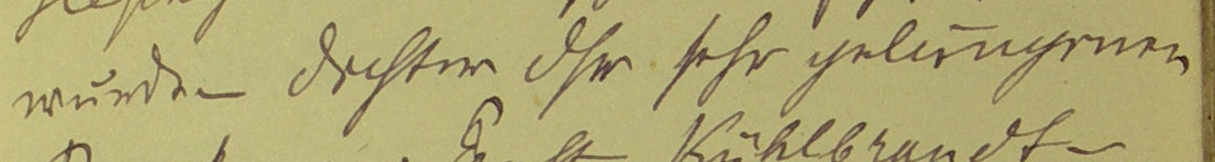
wurden- Dichter dieser sehr gelungenen
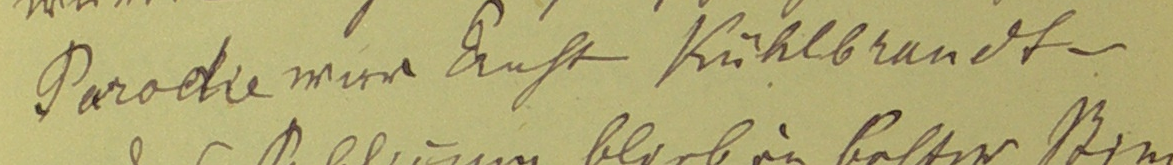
Parodie war Kühkbrandt ,
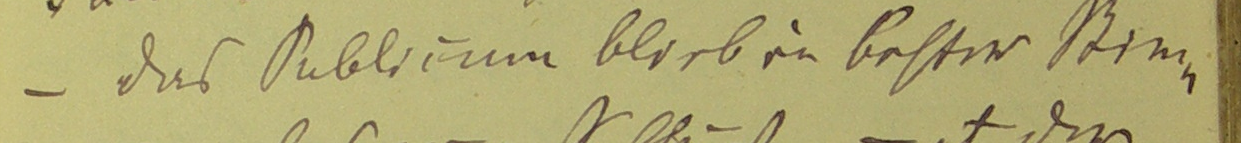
- das Publikum blieb in bester Stim¬
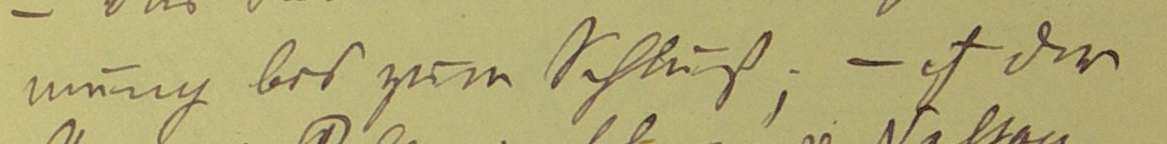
mung bis zum Schluß;--Auch der
